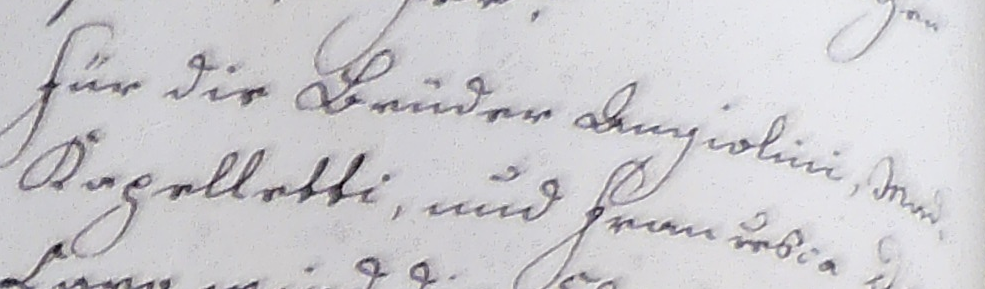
Für die Brüder Angiolini; dann
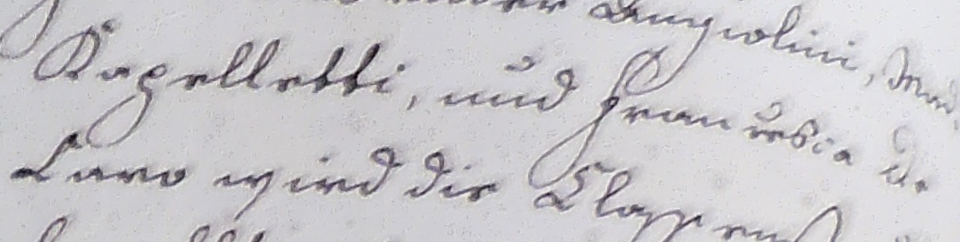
Kapelletti, und Francesca de
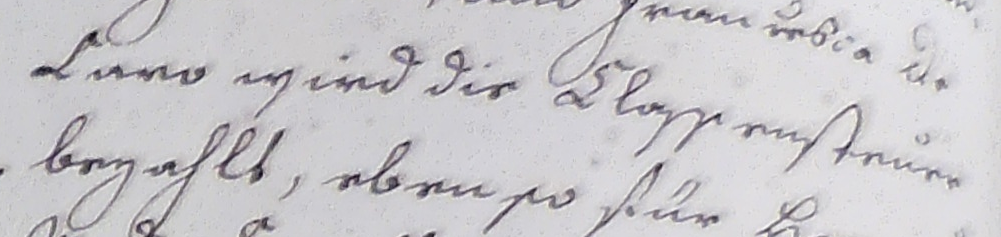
Laro wird die Classensteuer
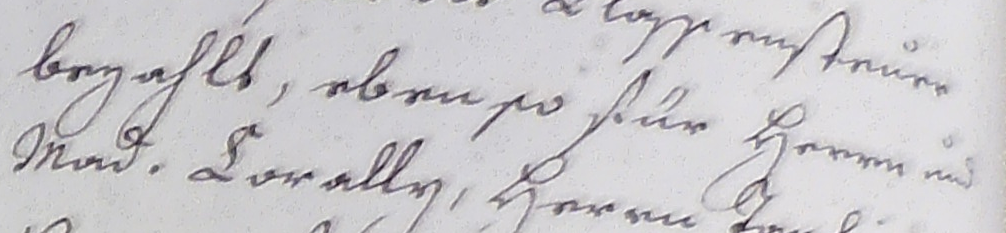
bezahlt, eben so für Herrn und
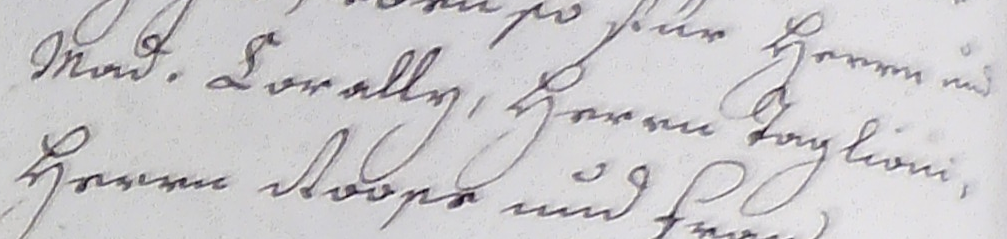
Mad. Corally, Herrn Taglioni,
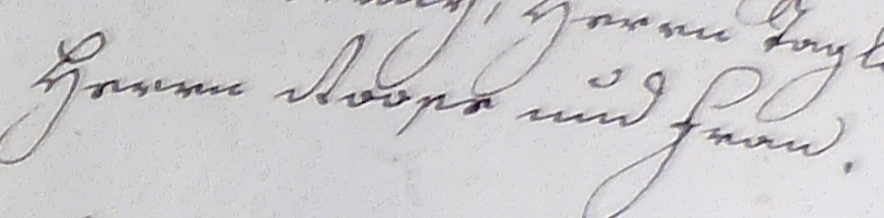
Herrn Roose und Frau.
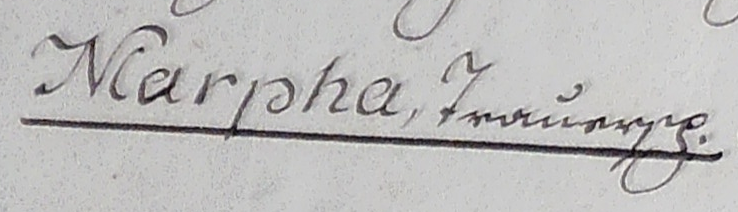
Marpha, Trauersp.
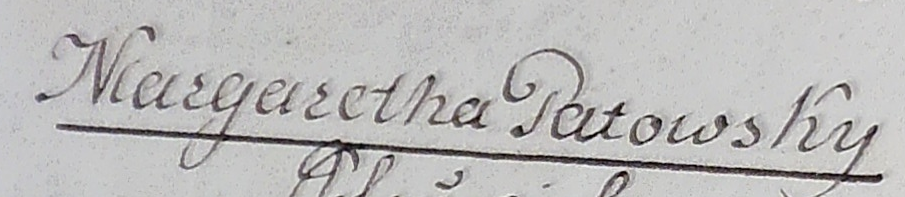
Margaretha Patowsky
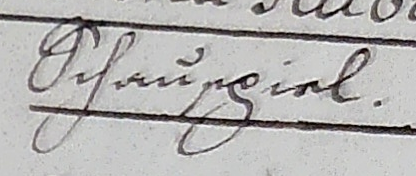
Schauspiel.
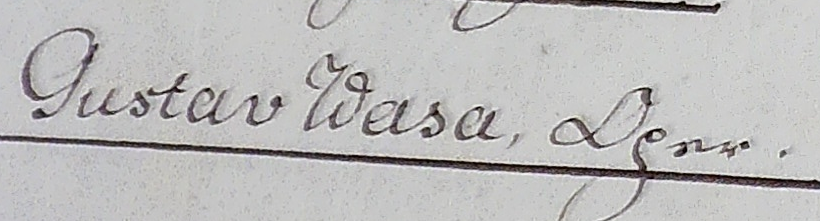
Gustav Wasa, Oper.
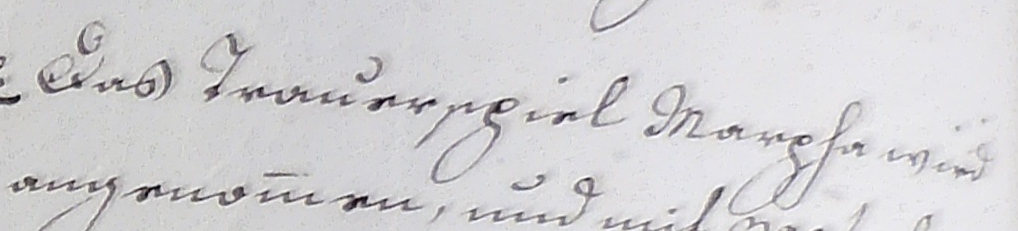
Das Trauerspiel Marpha wird
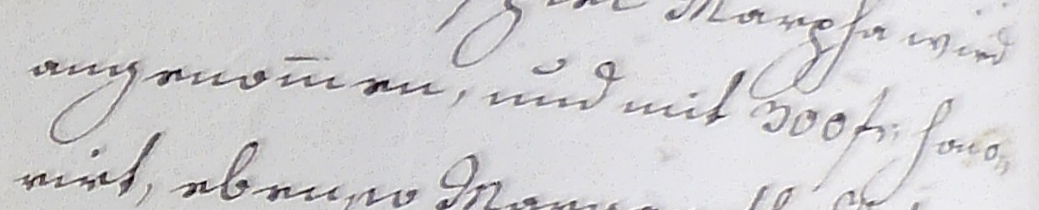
genom̅en, und mit 300fr. hono¬
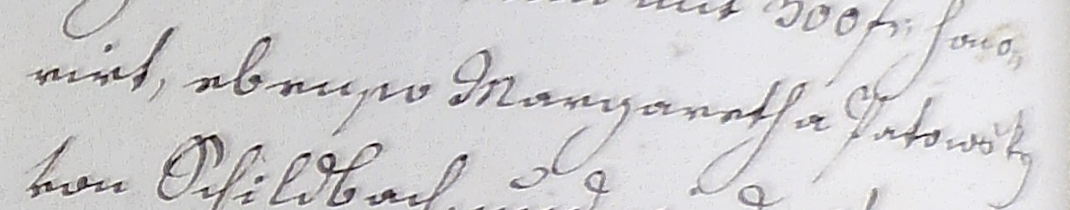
rirt, ebenso Margaretha Patowsky
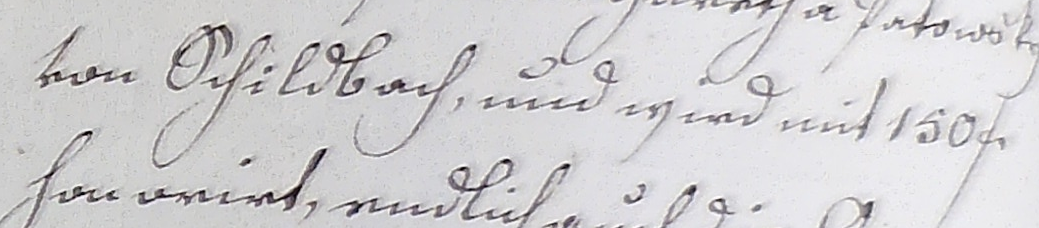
von Schildbach, und wird mit 150fr.
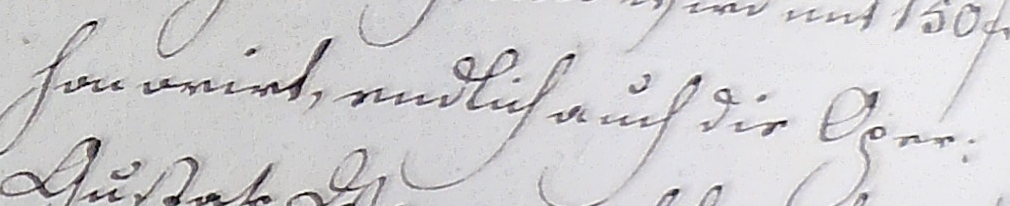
honorirt, endlich auch die Oper:
